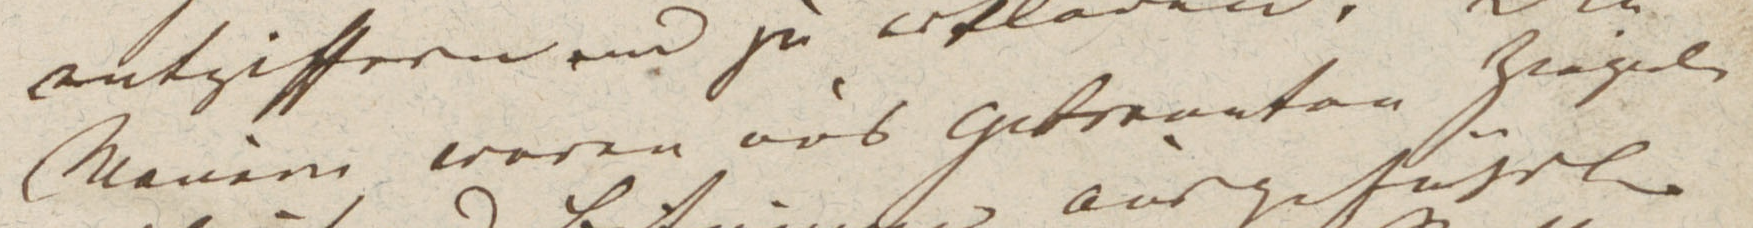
Mauern waren aus gebrannten Ziegeln
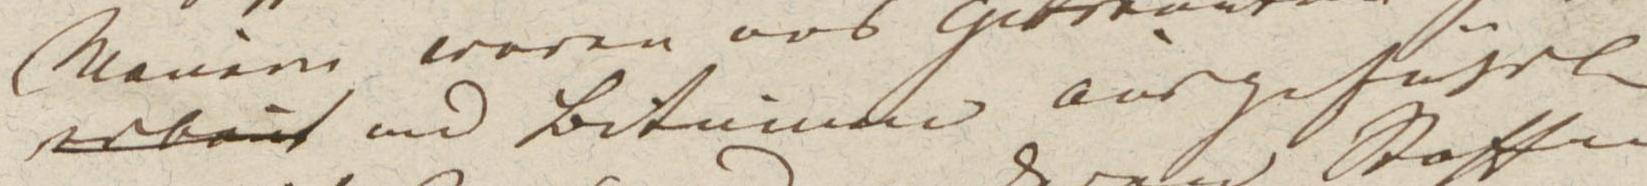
erbaut und Bitumen ausgeführt
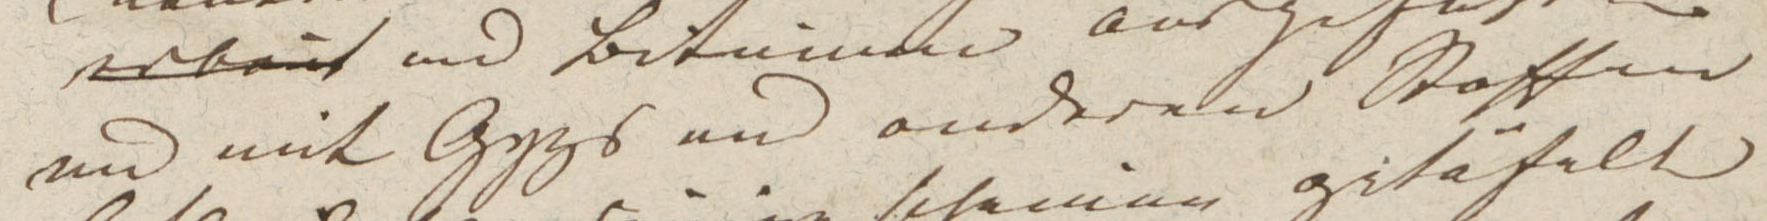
und mit Gyps und anderen Stoffen
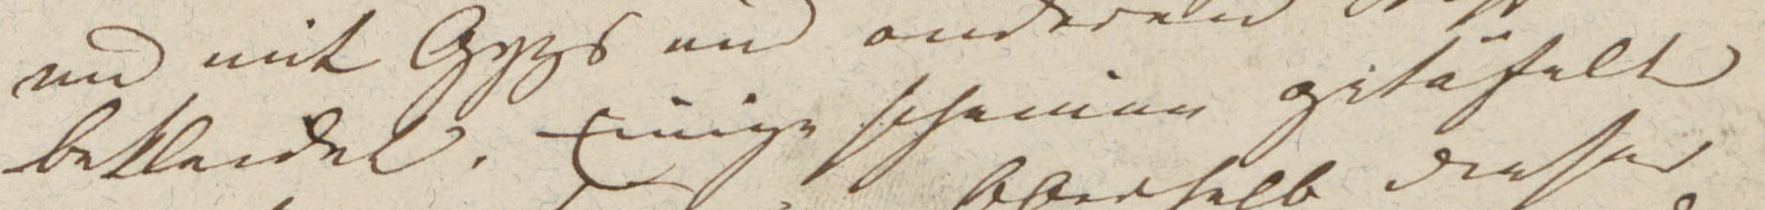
bekleidet. Einige scheinen getäfelt
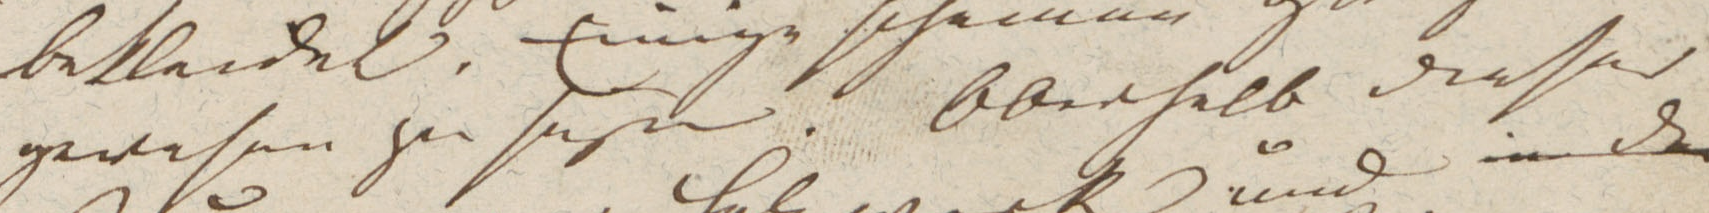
gewesen zu seyn. Oberhalb dieser
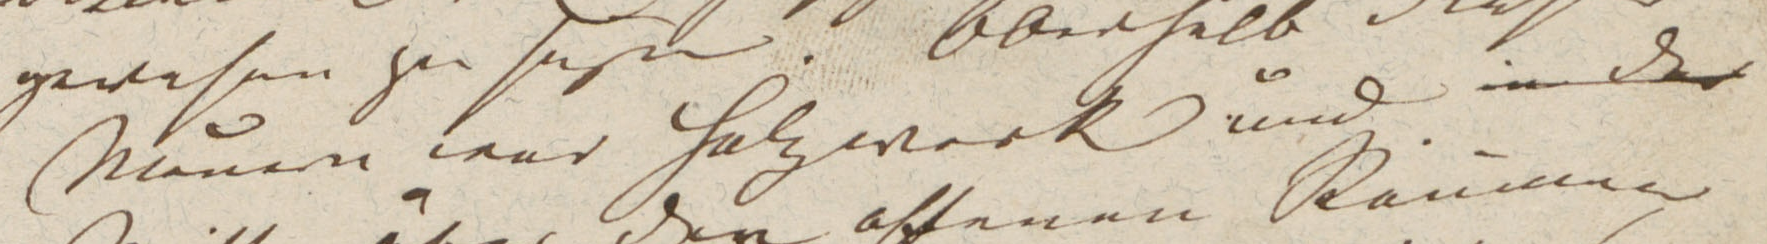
Mauern war Holzwerk und in der
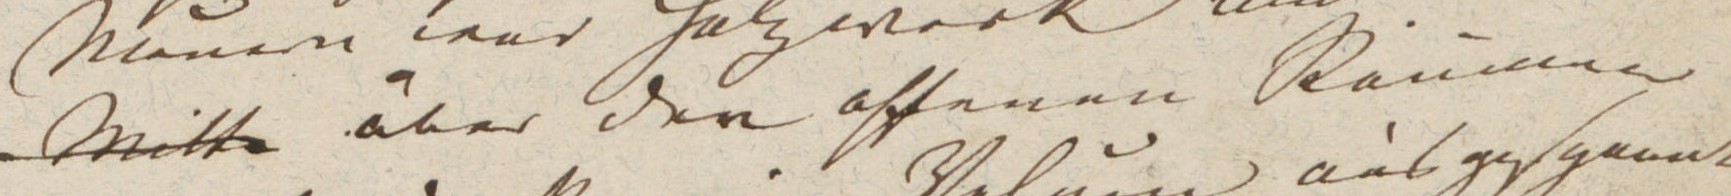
Mitte über den offenen Räumen
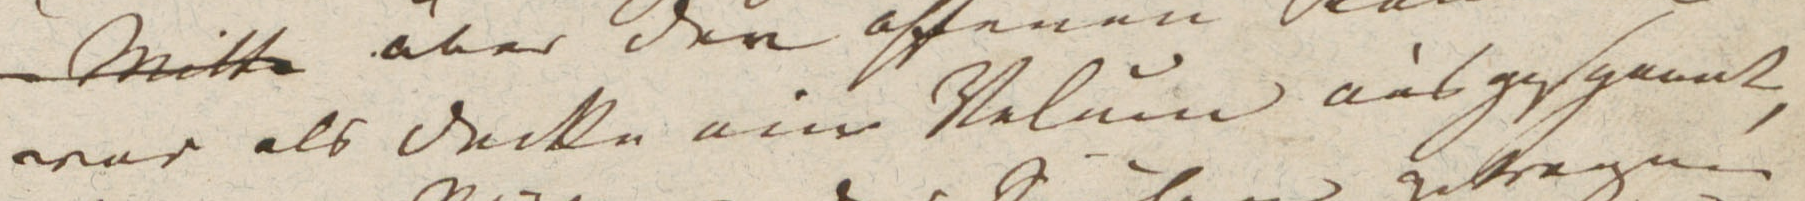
war als Decke ein Velum ausgespannt,
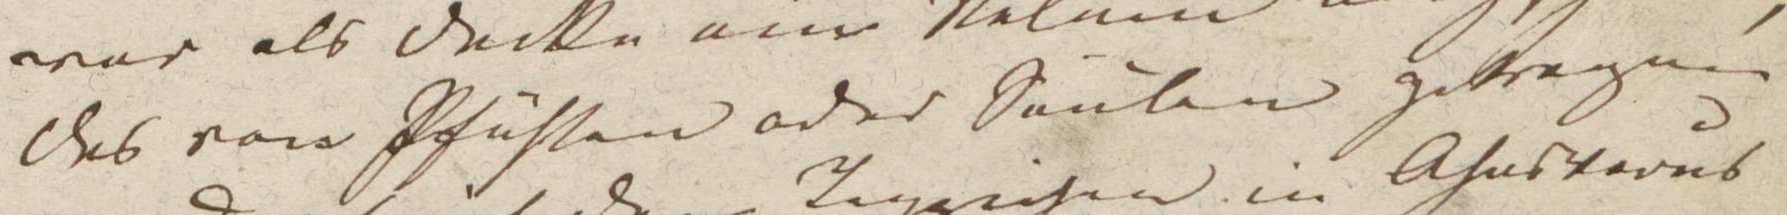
das von Pfählen oder Säulen getragen
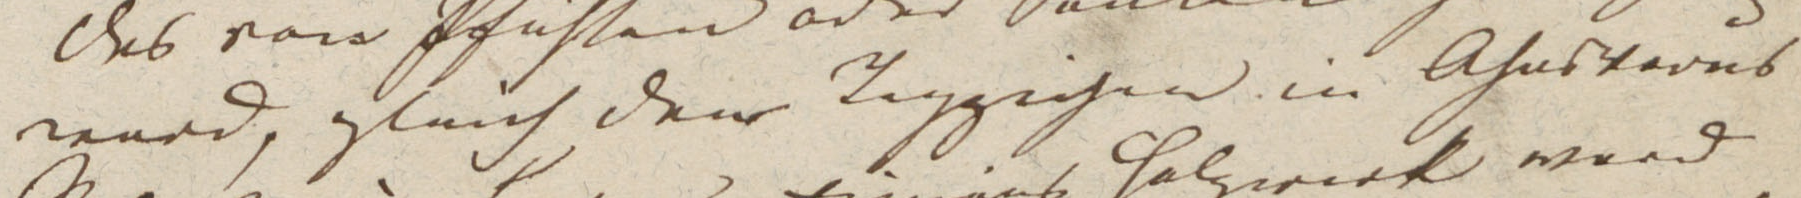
ward, gleich den Teppichen in Ahasvarus
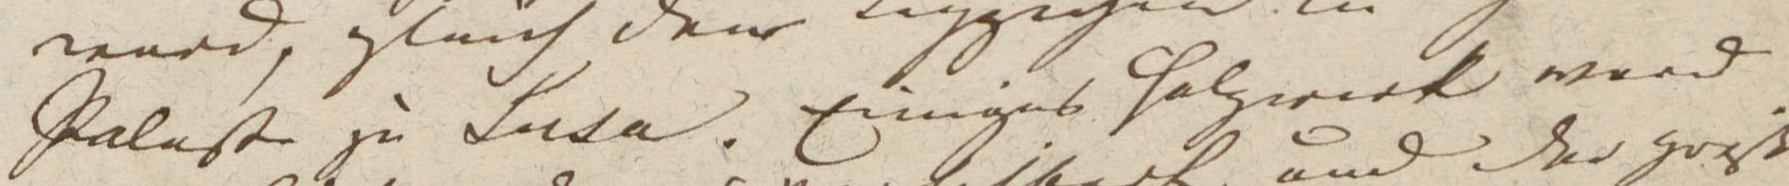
Palast zu Susa. Einiges Holzwerk ward
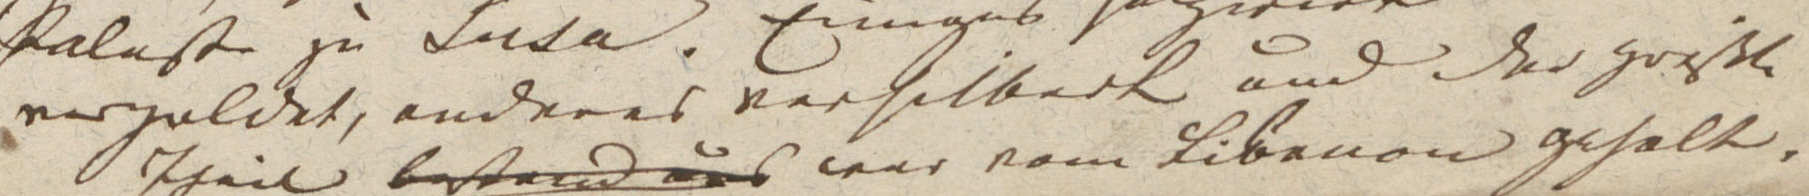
vergoldet, anderes versilbert und der grösste
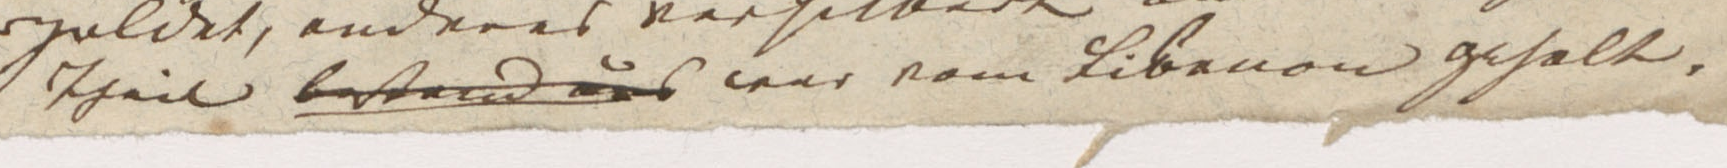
Theil bestand aus war vom Libanon geholt.
